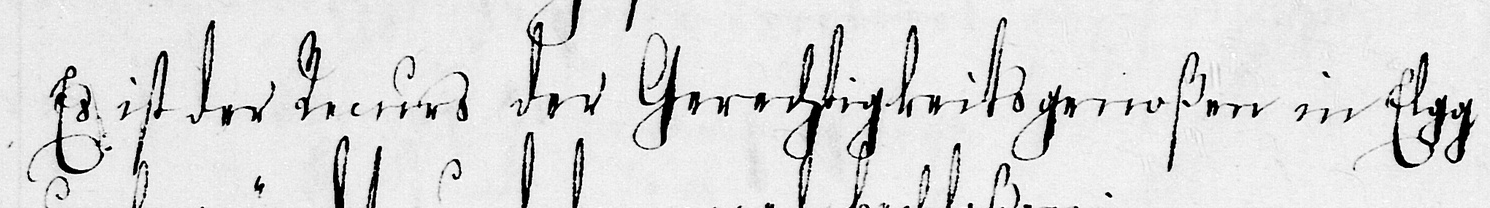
Es ist der Recurs der Gerechtigkeitsgenoßen in Elgg
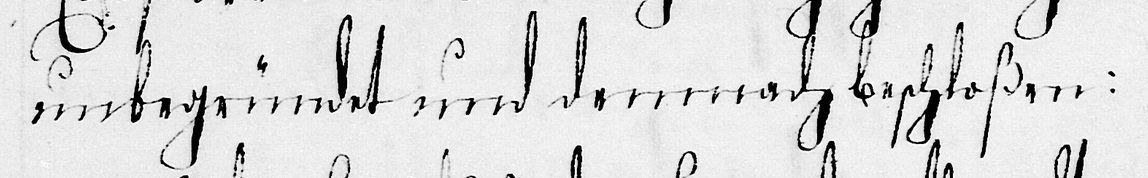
unbegründet und demnach beschloßen:
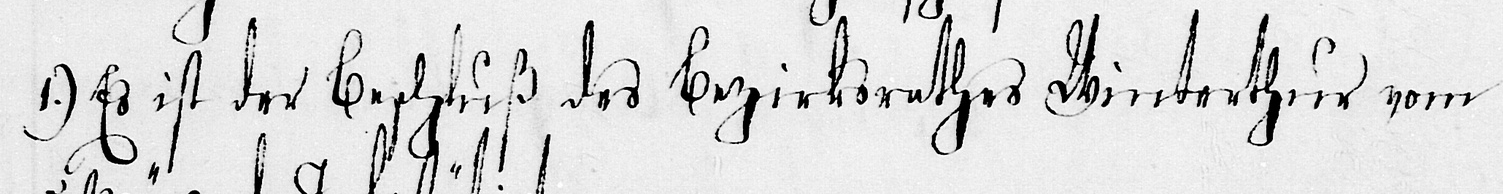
1.) Es ist der Beschluß des Bezirksrathes Winterthur vom
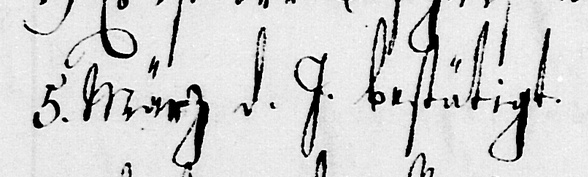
5. März d. J. bestätigt.
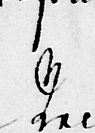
1.
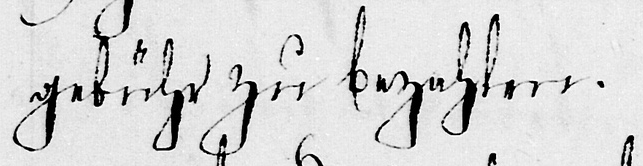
ygebühr zu bezahlen.
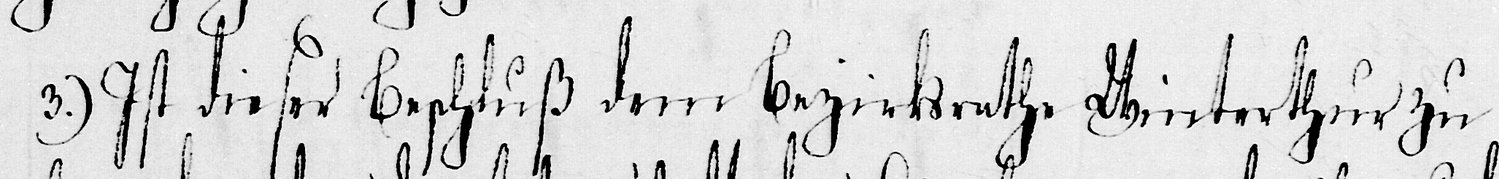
3.) Ist dieser Beschluß dem Bezirksrathe Winterthur zu
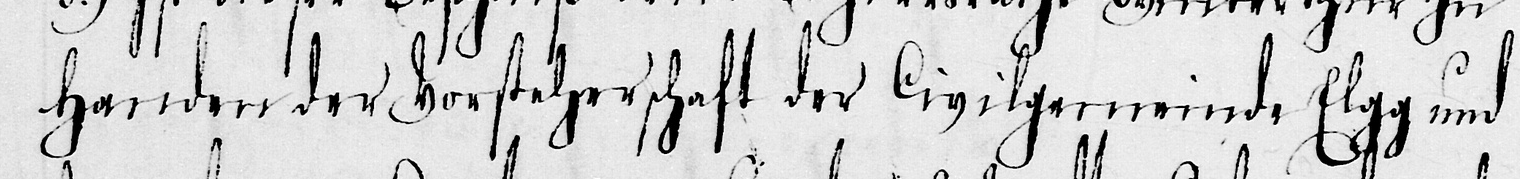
Handen der Vorsteherschaft der Civilgemeinde Elgg und
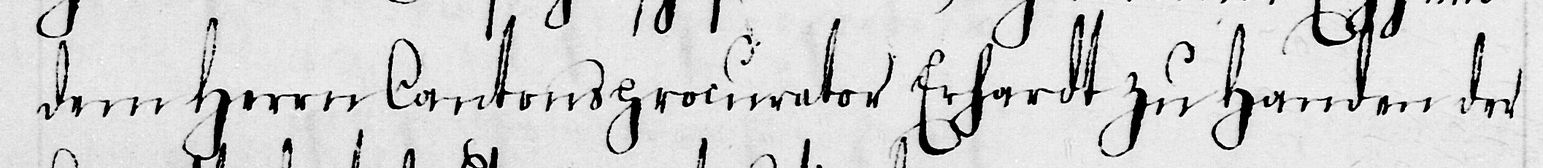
dem Herrn Cantonsprocurator Erhardt zu Handen der
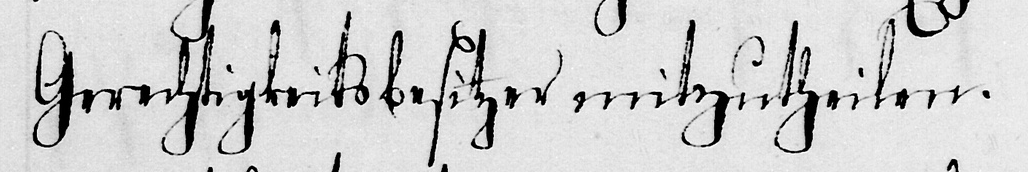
Gerechtigkeitsbesitzer mitzutheilen.
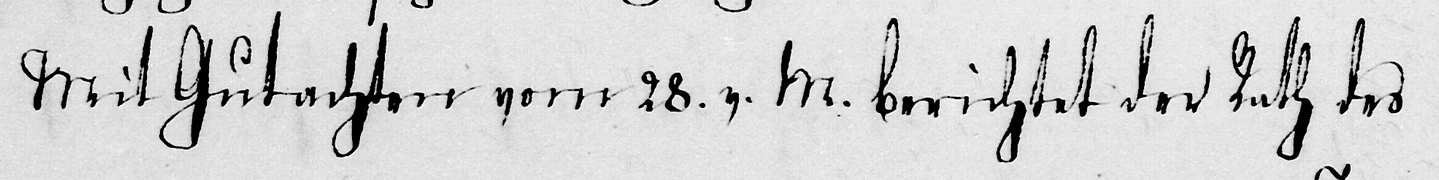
Mit Gutachten vom 28. v. M. berichtet der Rath des
